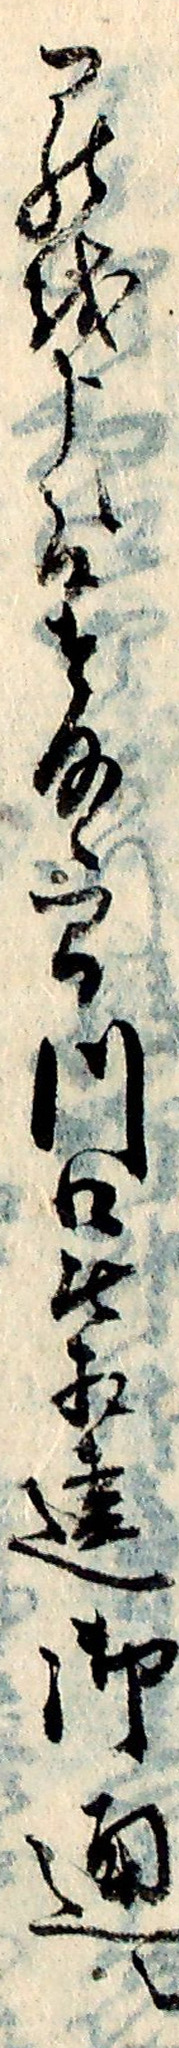罷越申度奉存候間川口無相違御通し
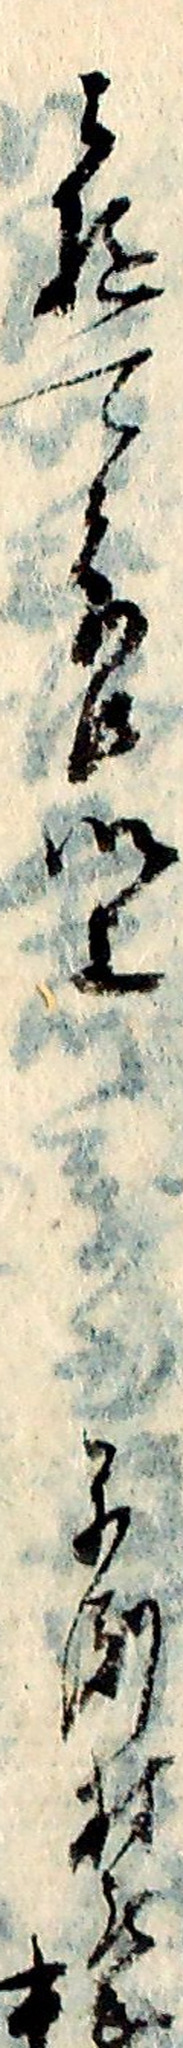被遊可被下候以上早淵村庄屋
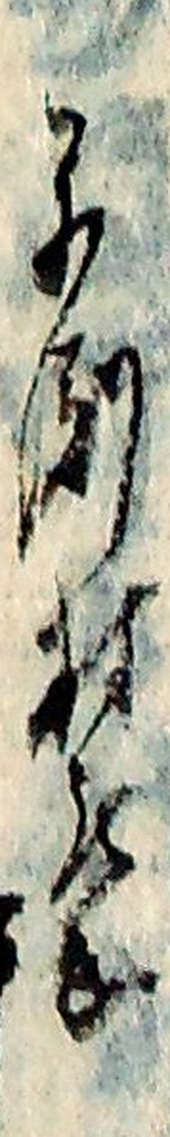早淵村庄屋
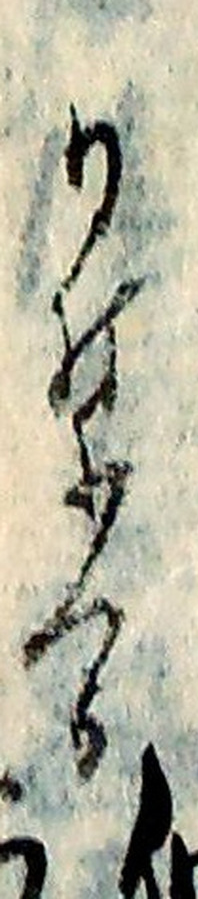同村五人与
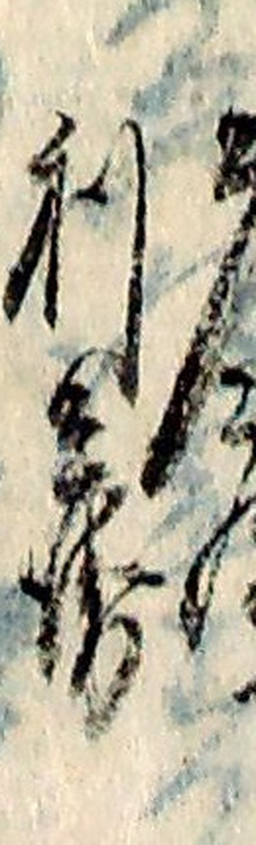利兵衛
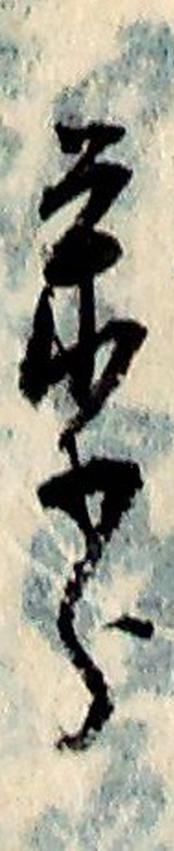栄五郎
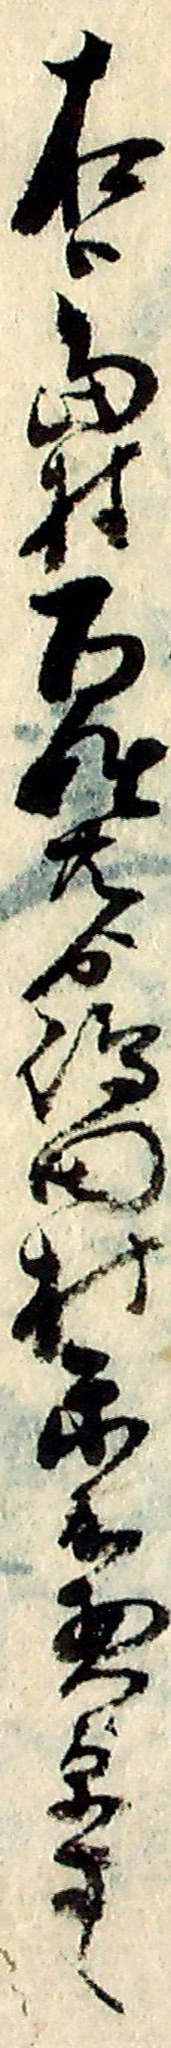右は当村百姓共ゟ島田村米屋惣兵衛方へ
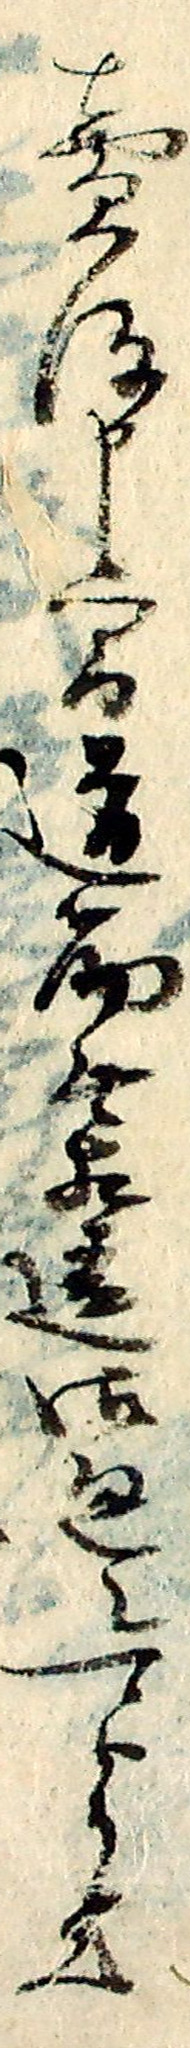売渡申候間道筋無相違御通し可被下候以上
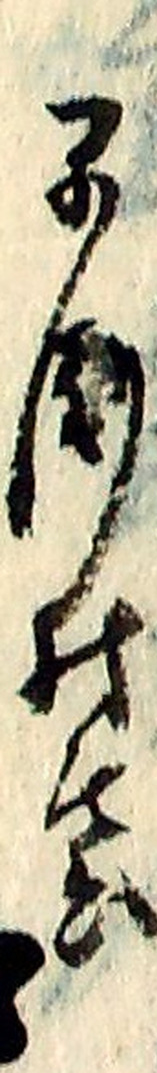早淵村庄屋
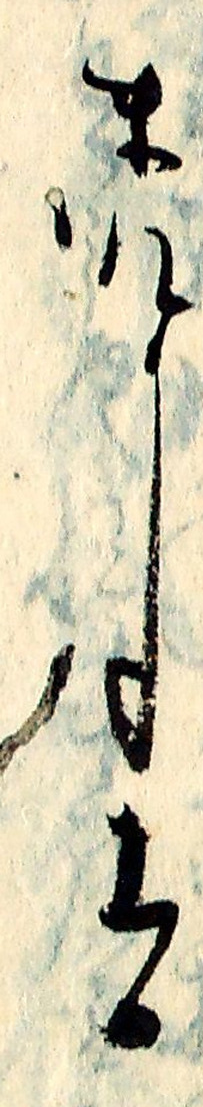未八月十一日
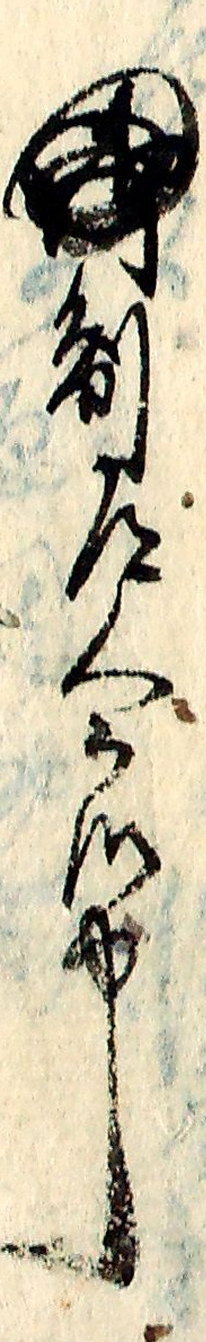御制道人衆中

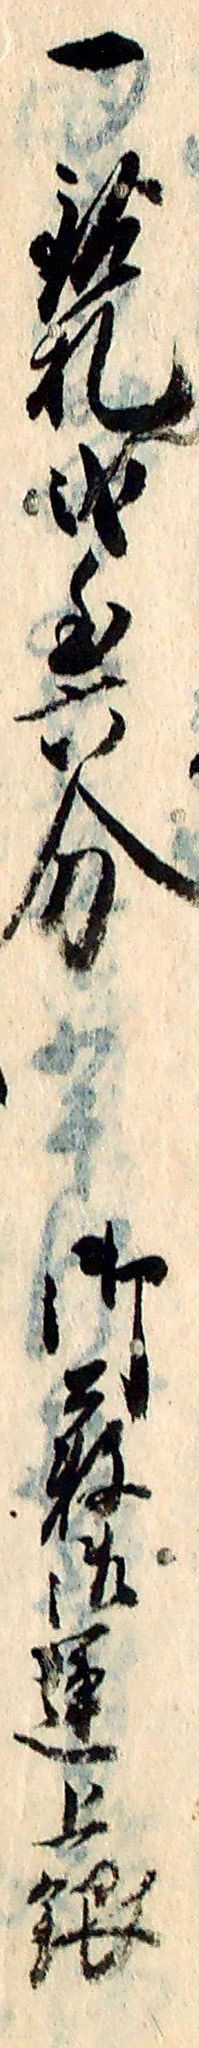一銀札弐匁六分御藪御運上銀
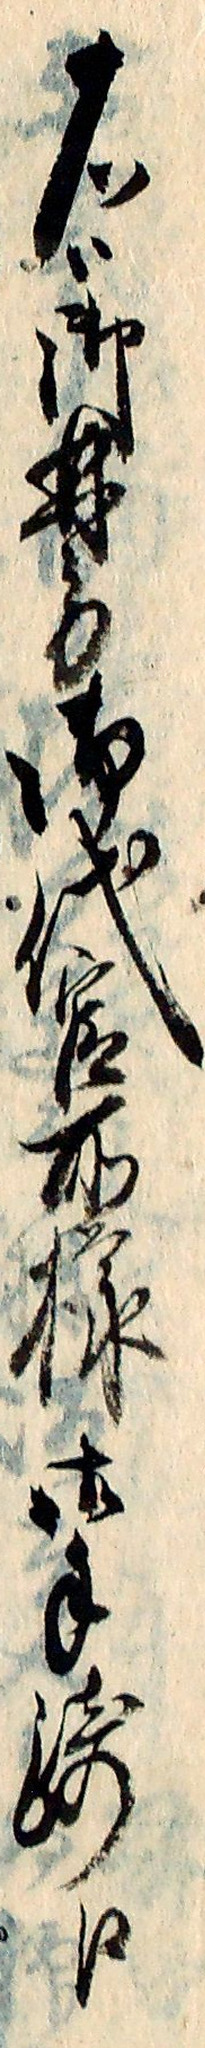右は御林方御代官所様御手崎え
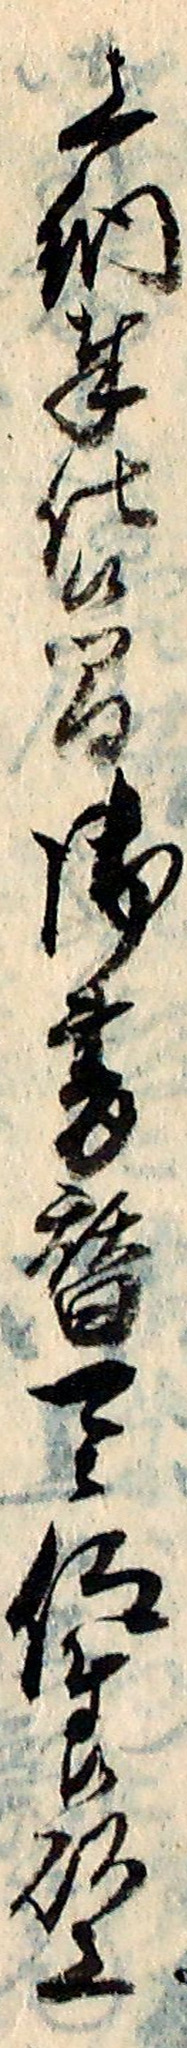上納奉仕候間御書替可被仰付候以上
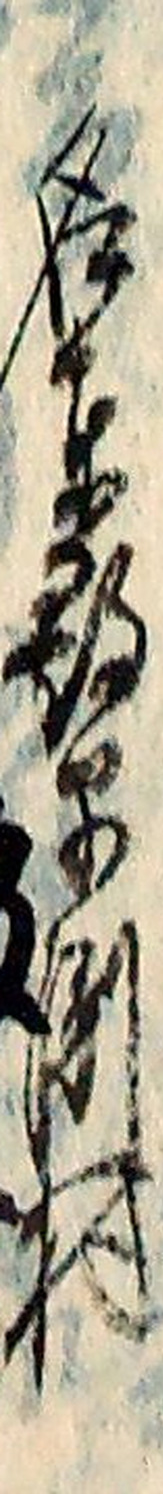名東郡早淵村
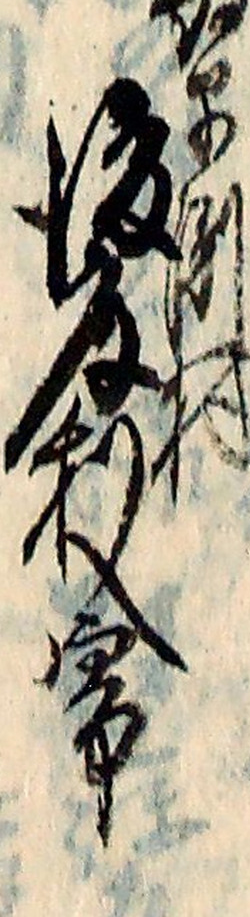後藤利八郎
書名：諸御願書控(後藤氏壱番）
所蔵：鳴門教育大学 Naruto University of Education
